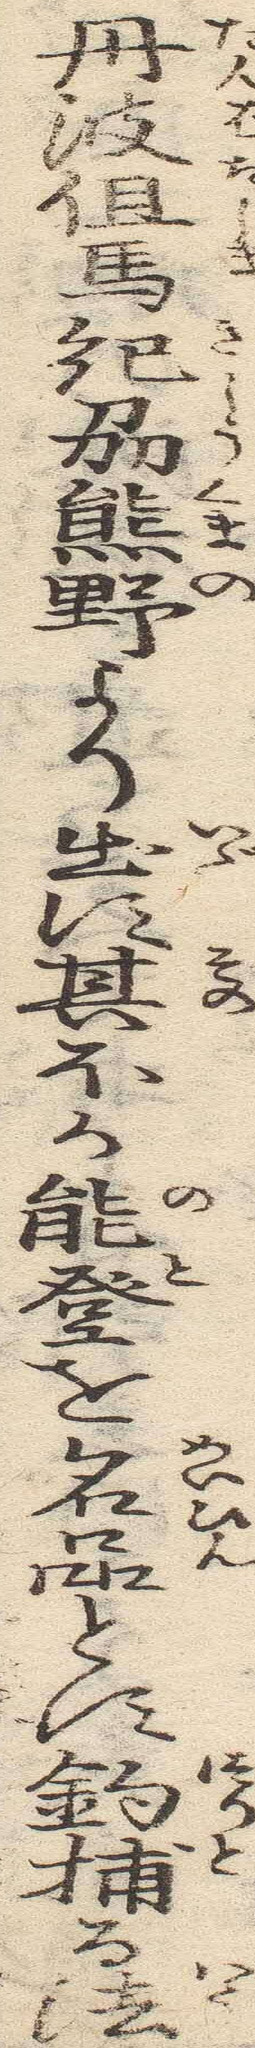丹波但馬紀州熊野より出す其ほか能登を名品とす釣捕る法
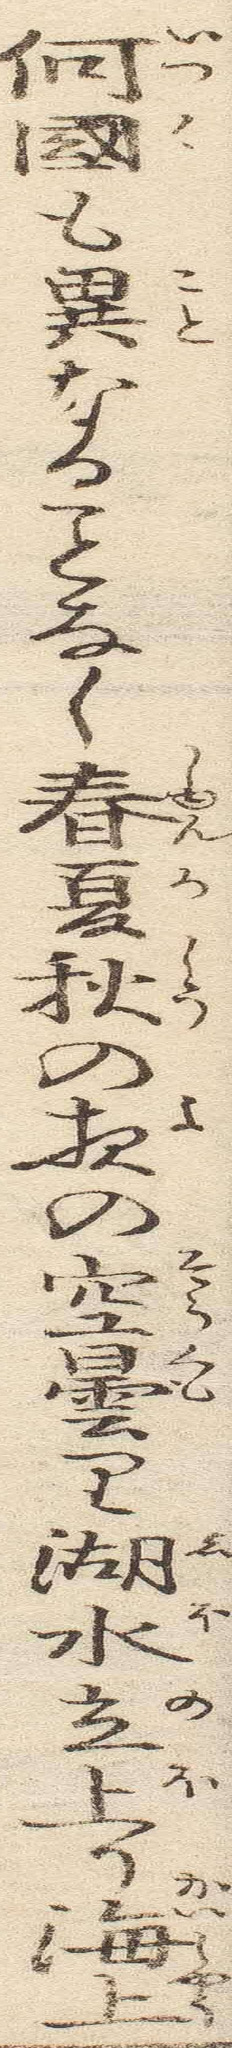何国も異なることなし春夏秋の夜の空曇り湖水立上り海上
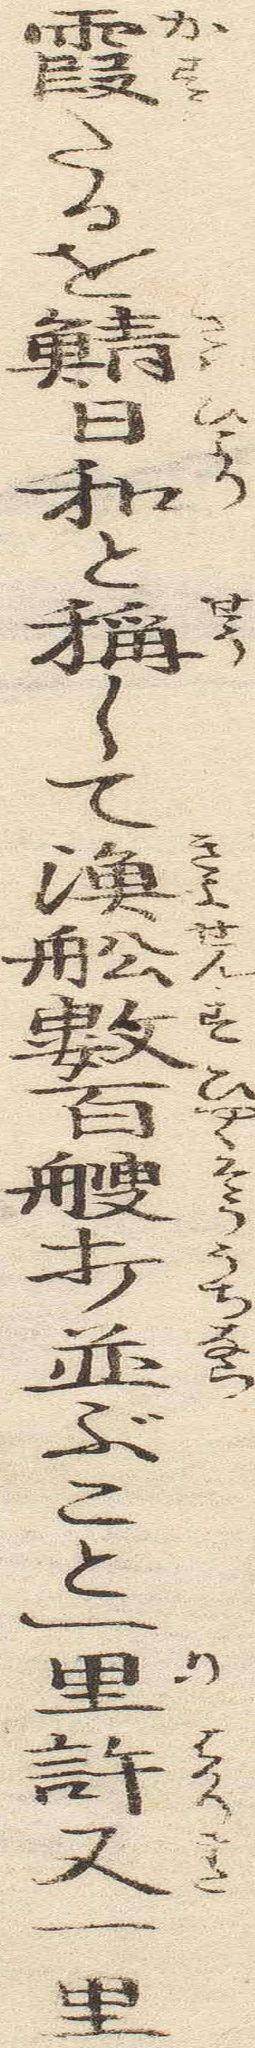霞たるを鯖日和と称して漁船数百艘打並ぶこと一里許又一里
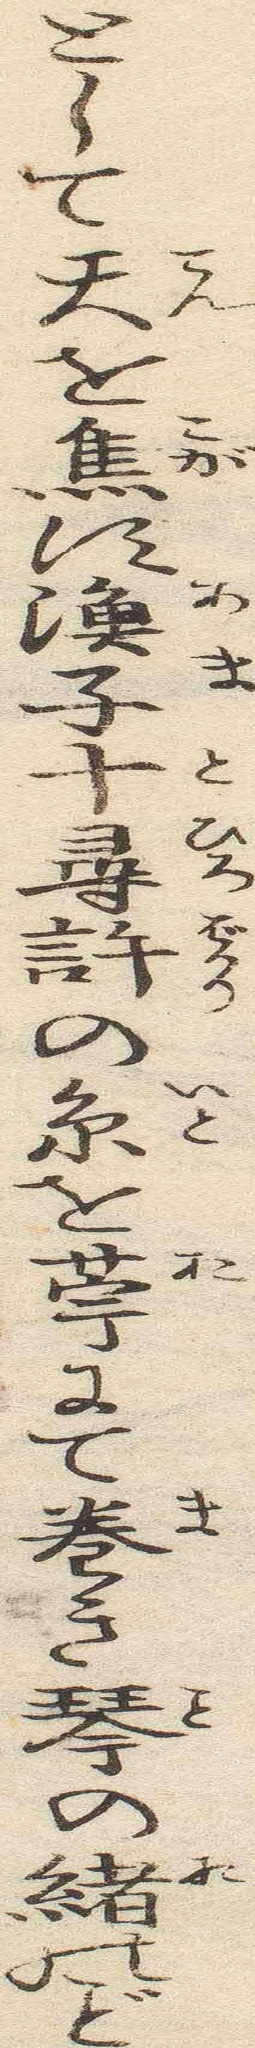として天を焦す漁子十尋許の糸をにて巻き琴の緒のごと
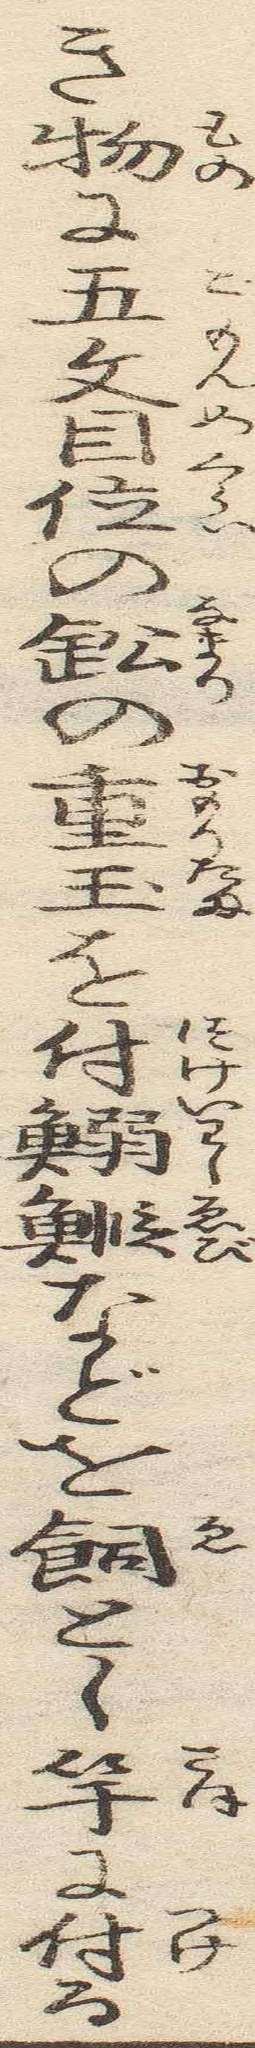き物に五文目位の鉛の重玉を付鰯鰕などを飼とし竿に付る
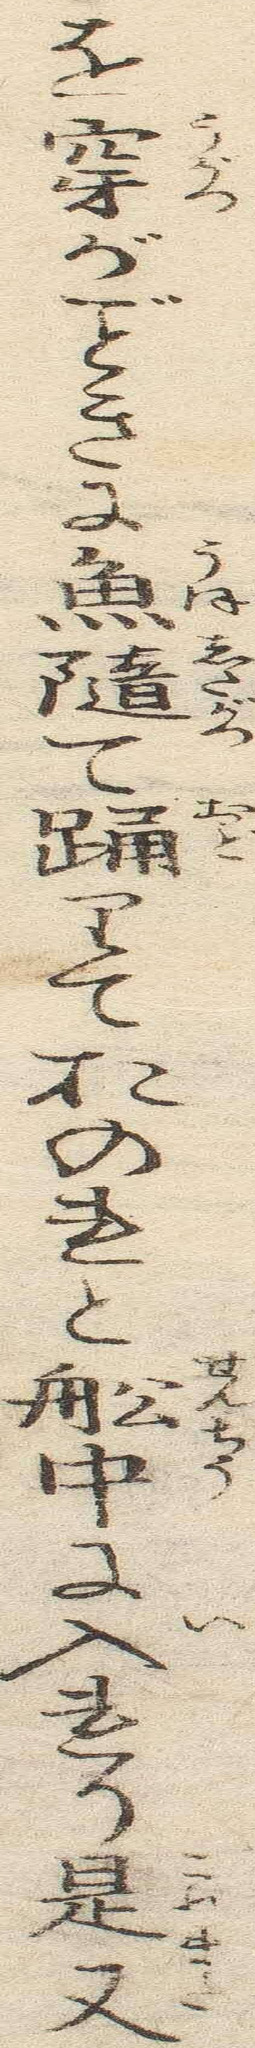を穿がごときに魚隨て踊りておのれと船中に入れり是又
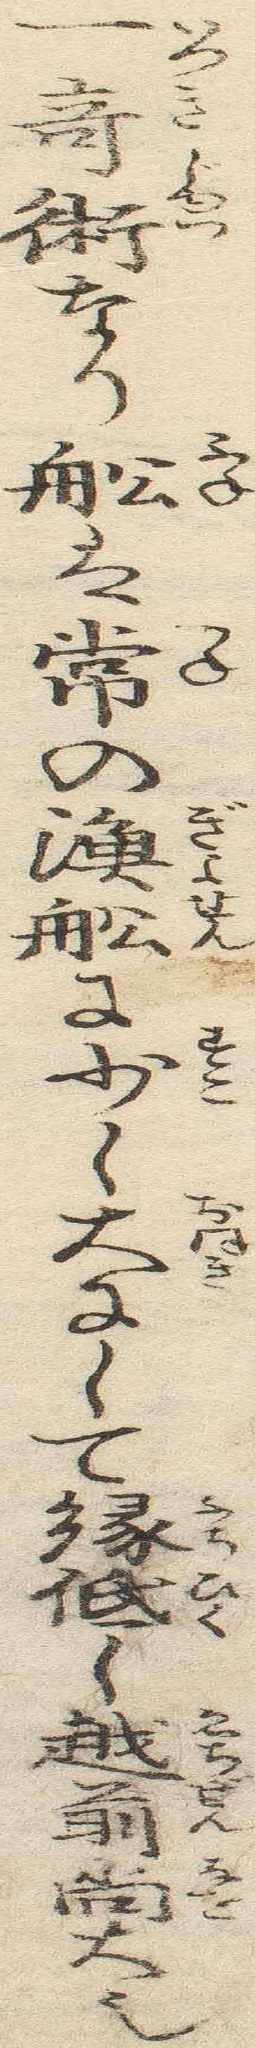一奇術なり船は常の漁船に少し大にして縁低し越前尚大也
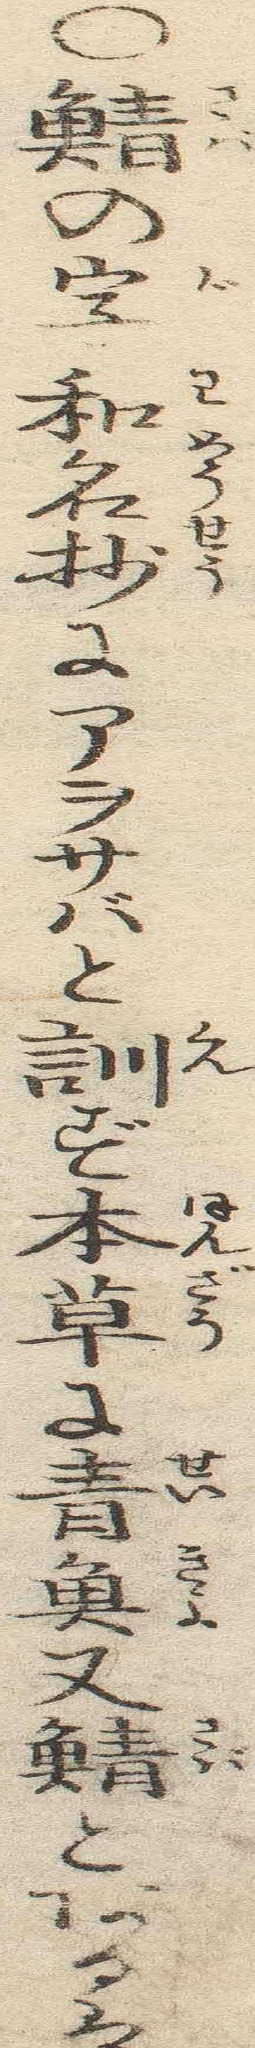○鯖の字和名抄にアヲサバと訓ず本草に青魚又鯖とあるは
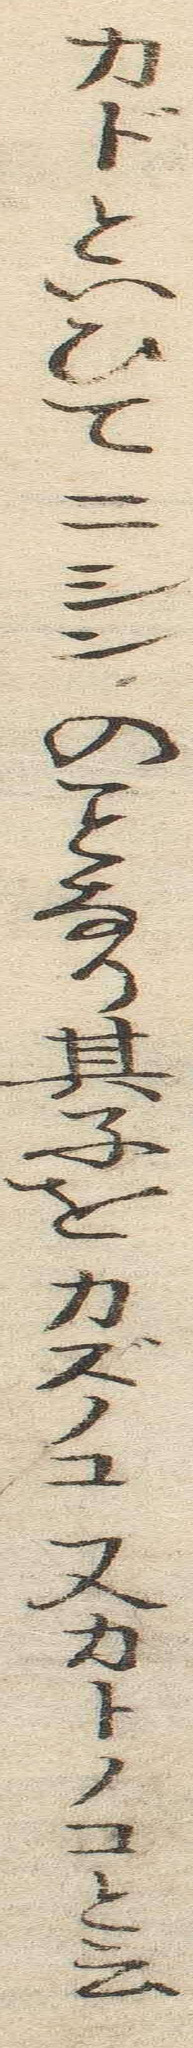カドといひてニシンのことなり其子をカズノコ又カトノコと云
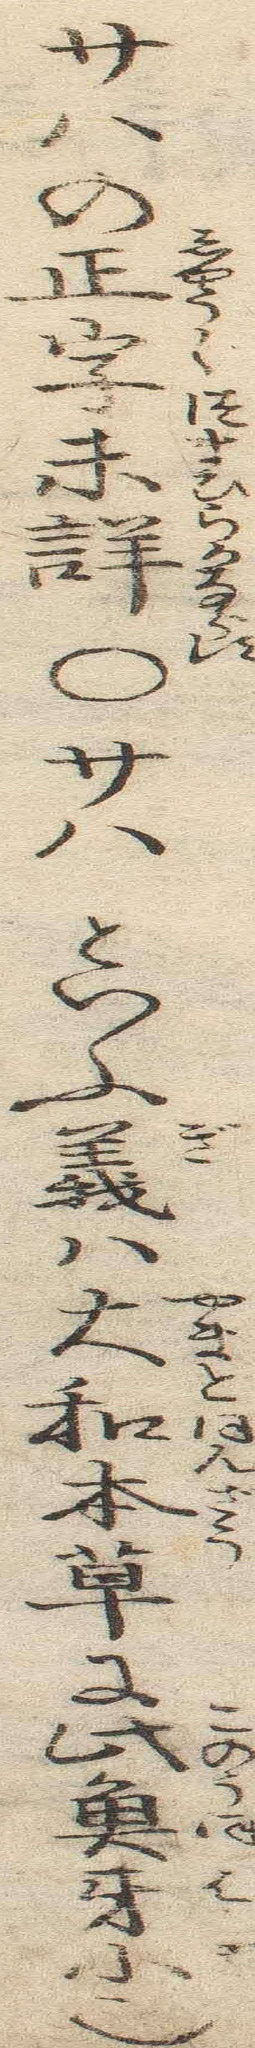サハの正字未詳○サハといふ義は大和本草に此魚牙小也
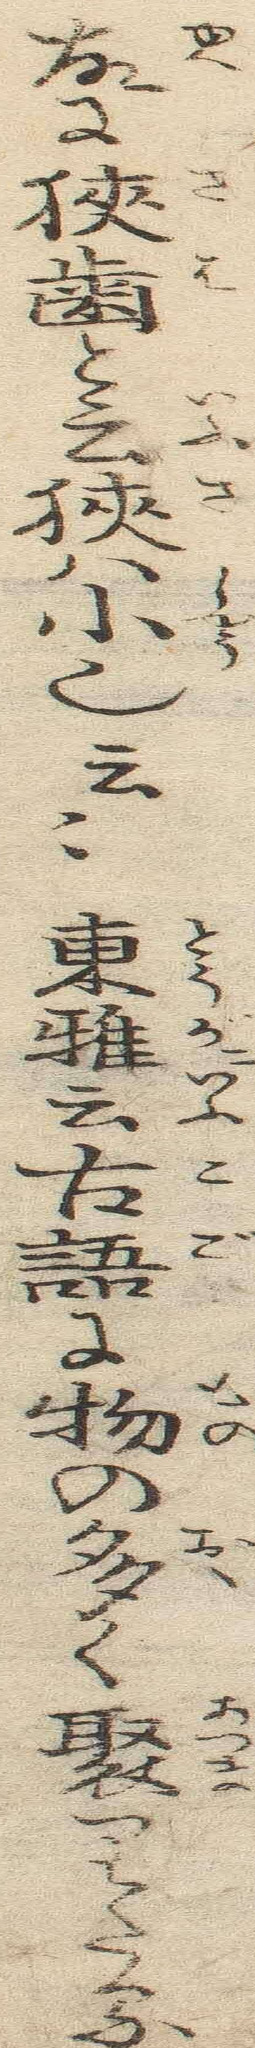故に狭歯と云狭は小也云々東雅云古語に物の多く聚りたる
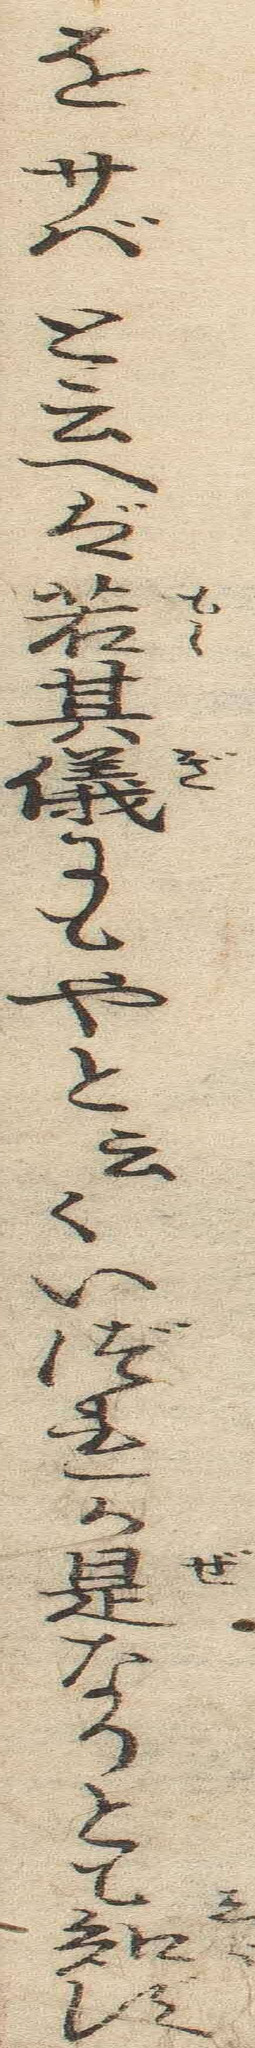をサバと云へば若其儀にもやと云々いづれか是なりとも知ず

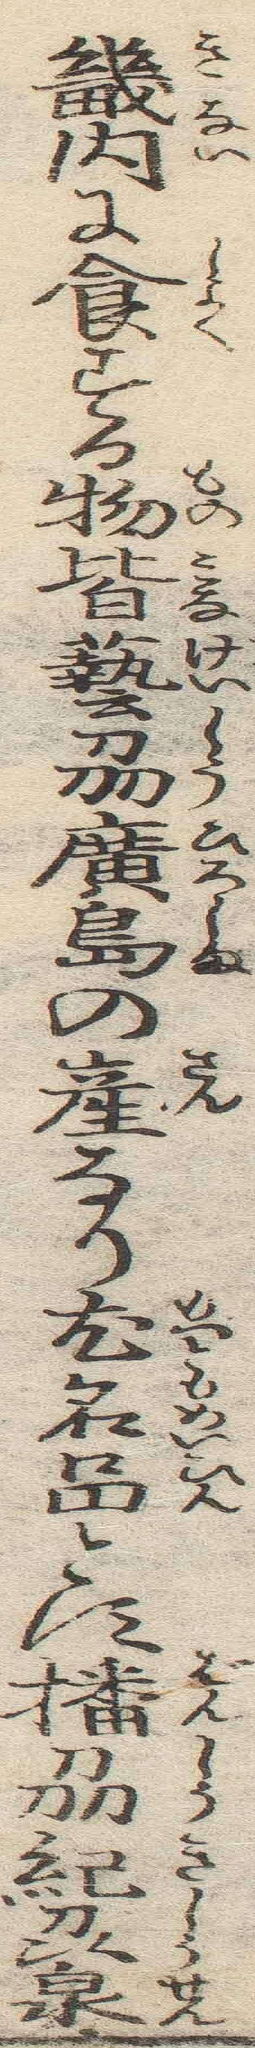畿内に食する物皆芸州広島の産なり尤名品とす播州紀州泉
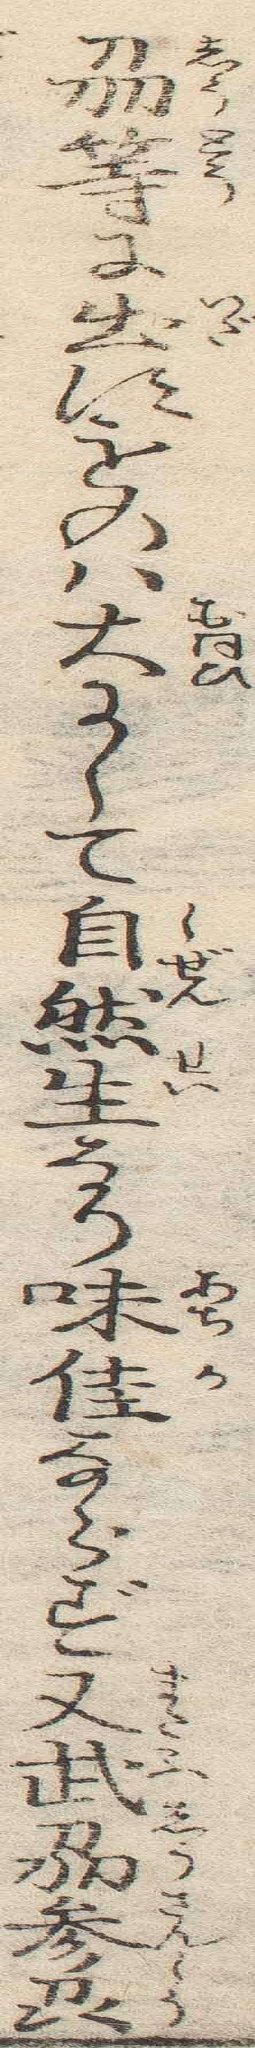州等に出すものは大にして自然生なり味佳ならず又武州参州
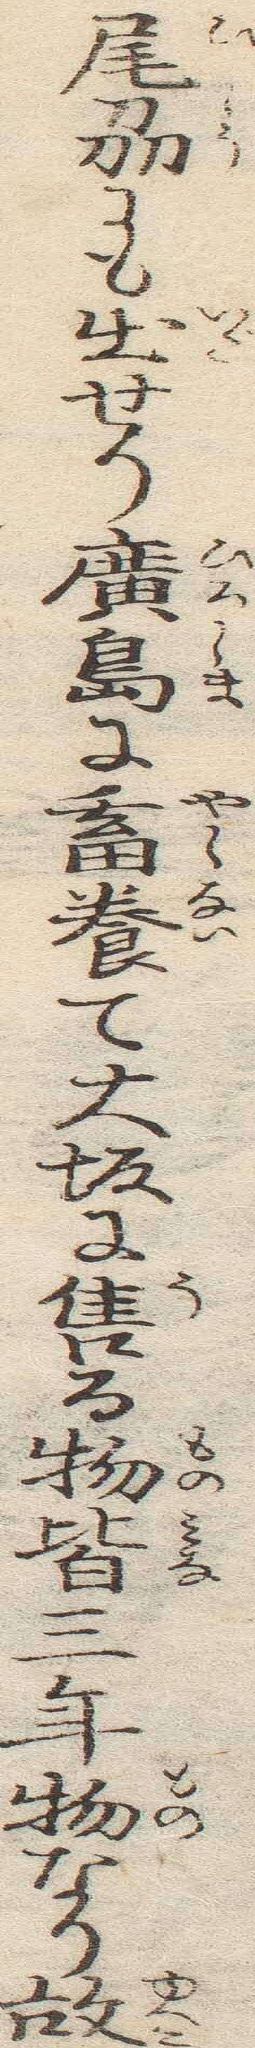尾州にも出せり広島に畜養て大坂に售る物皆三年物なり故
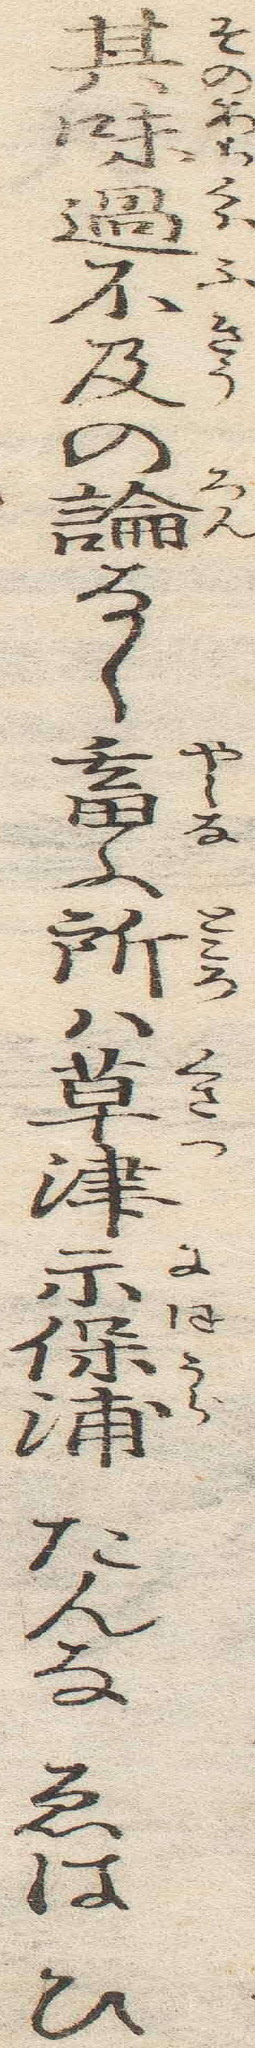其味過不及の論なし畜ふ所は草津示保浦たんなゑはひ
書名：日本山海名産図会
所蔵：東京学芸大学附属図書館 国文学研究資料館
